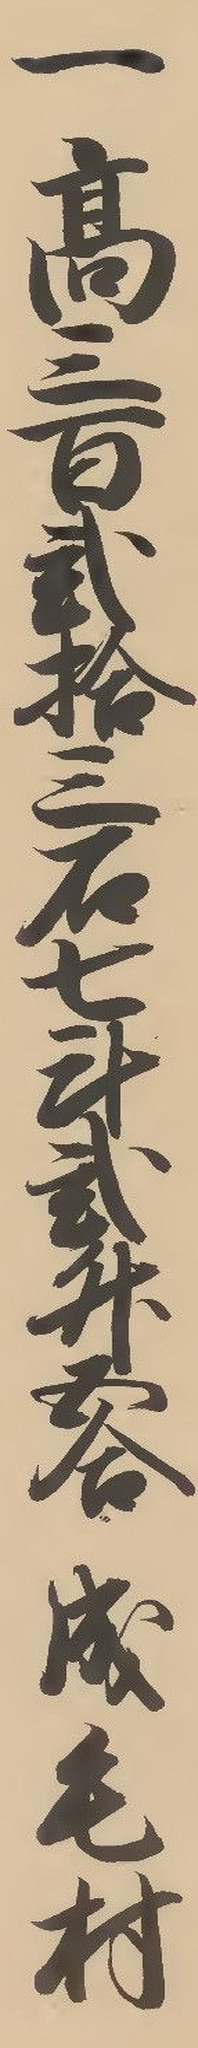一高三百弐拾三石七斗弐升五合成毛村
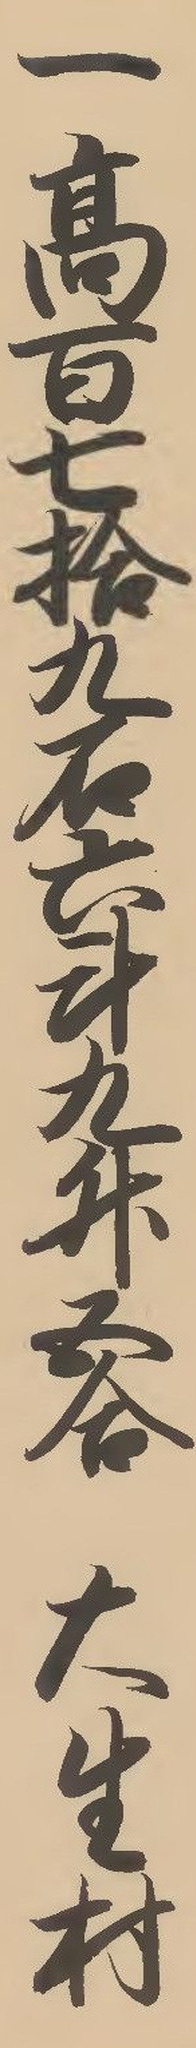一高百七拾九石六斗九升五合大生村
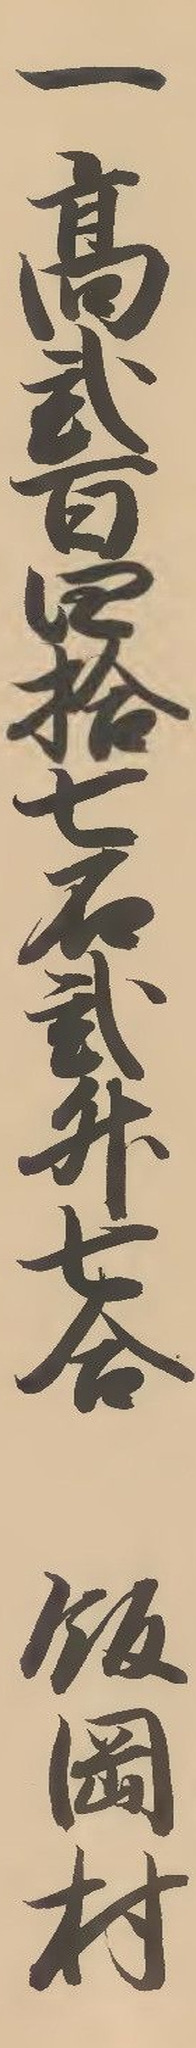一高弐百四拾七石弐升七合飯岡村
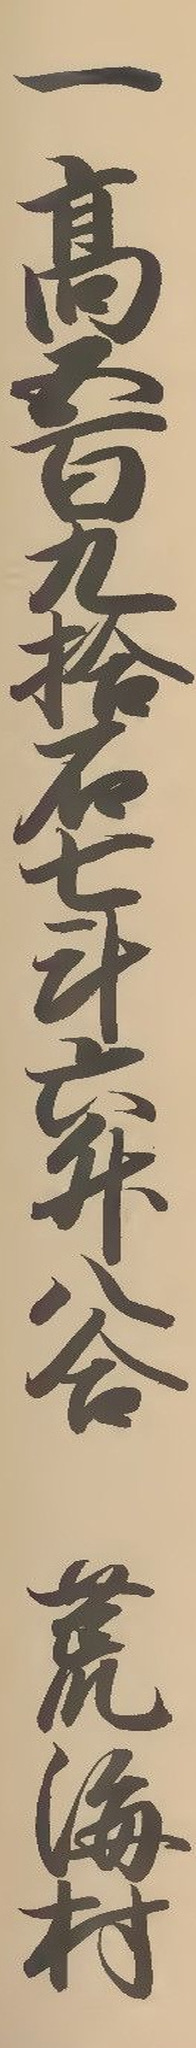一高五百九拾石七斗六升八合荒海村
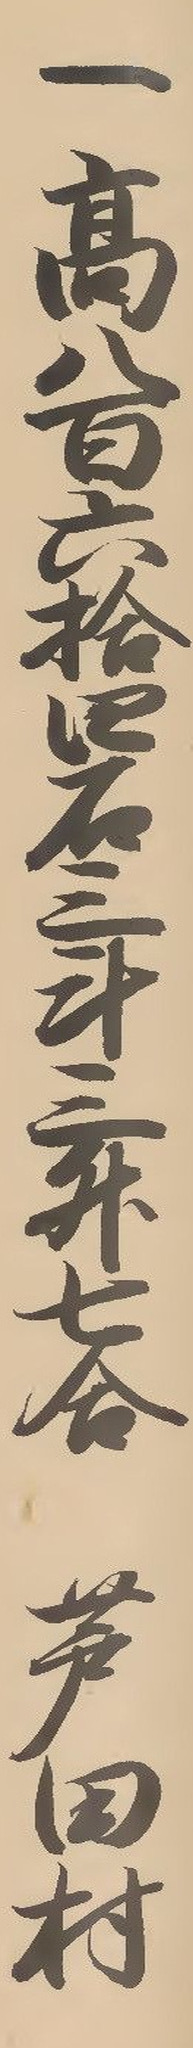一高八百六拾四石三斗三升七合芦田村
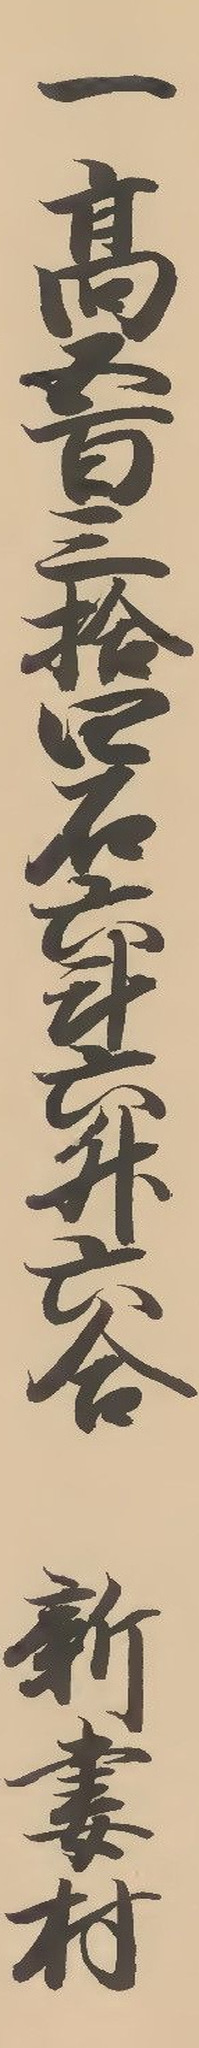一高五百三拾四石六斗六升六合新妻村
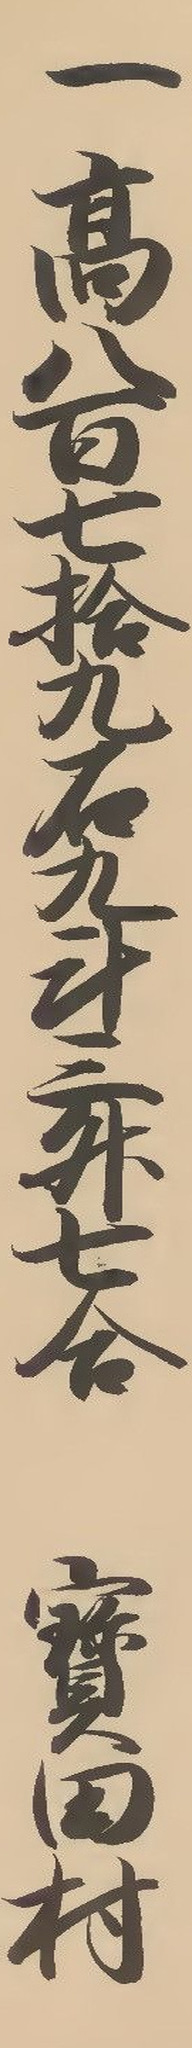一高八百七拾九石九斗三升七合宝田村
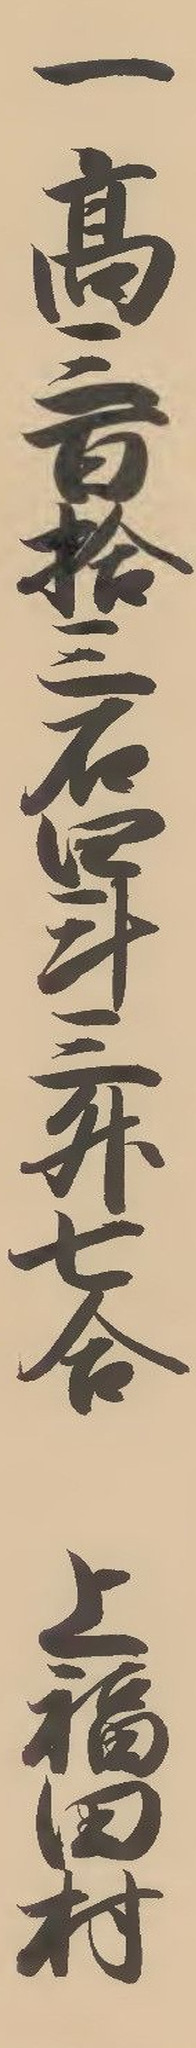一高三百拾三石四斗三升七合上福田村

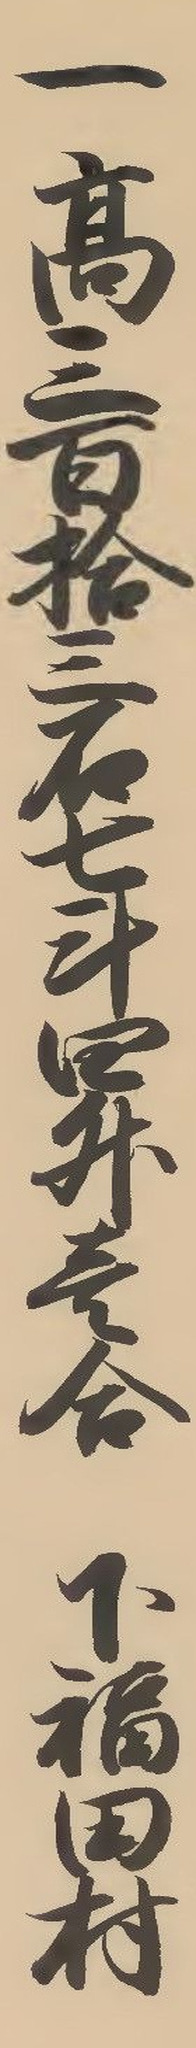一高三百拾三石七斗四升壱合下福田村
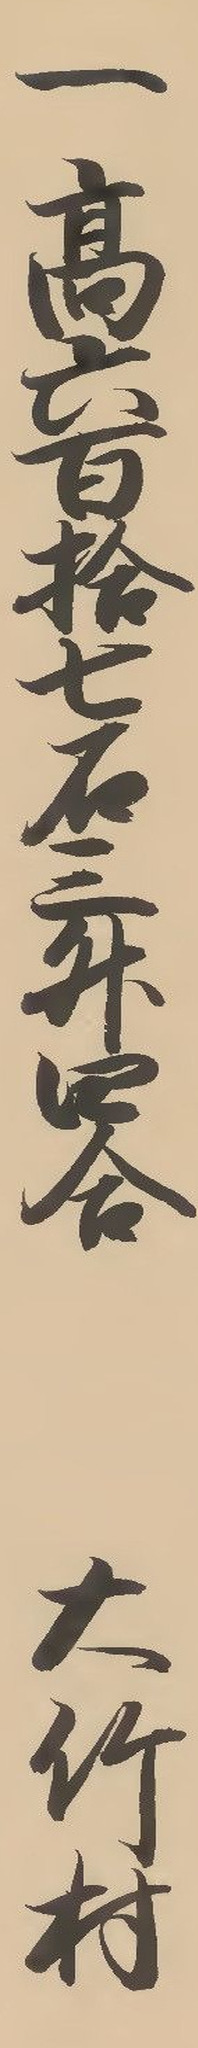一高六百拾七石三升四合大竹村
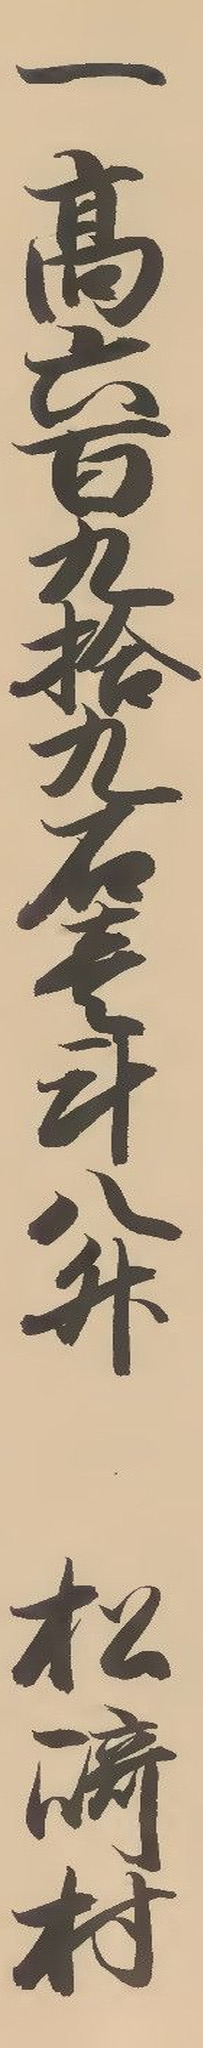一高六百九拾九石壱斗八升松崎村
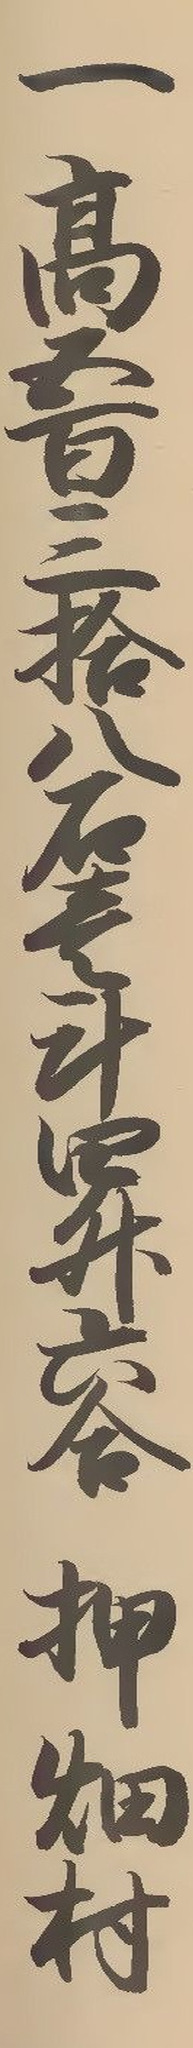一高五百三拾八石壱斗四升六合押畑村
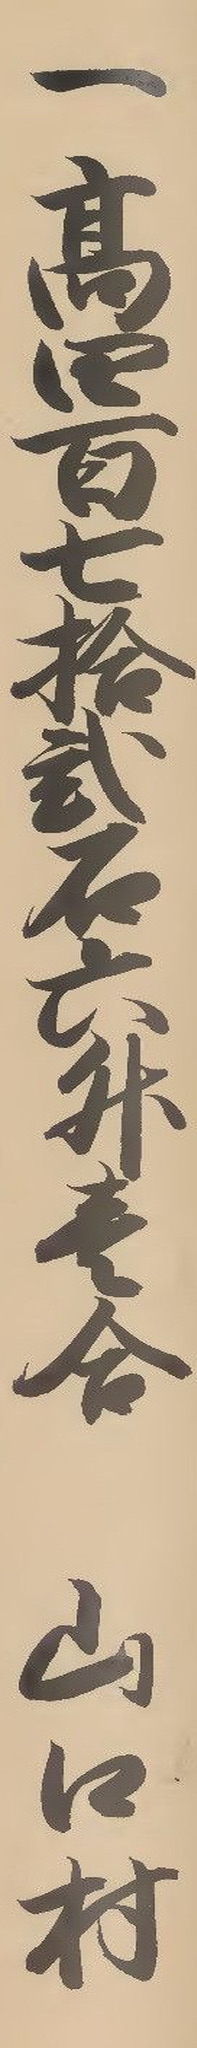一高四百七拾弐石六升壱合山口村
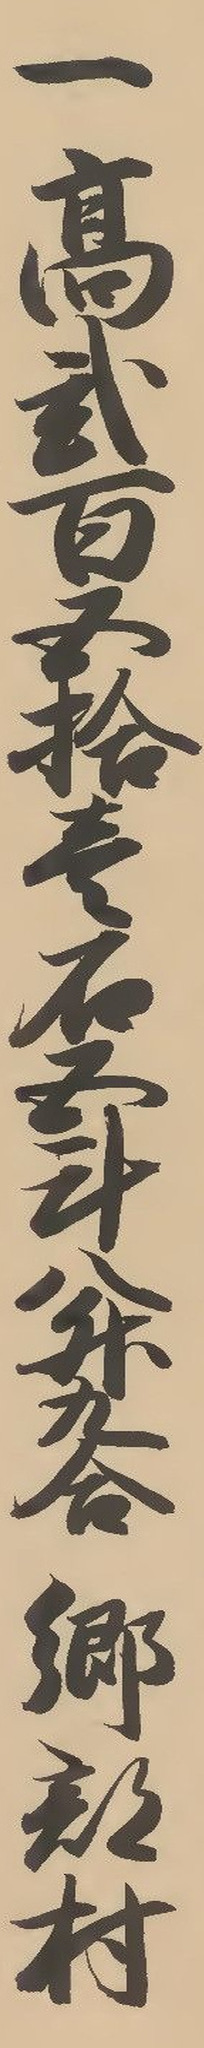一高弐百五拾壱石五斗八升九合郷部村
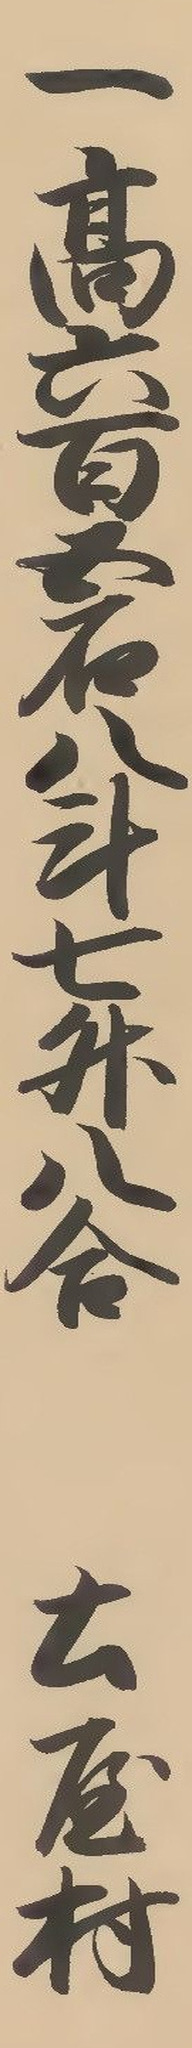一高六百五石八斗七升八合土屋村
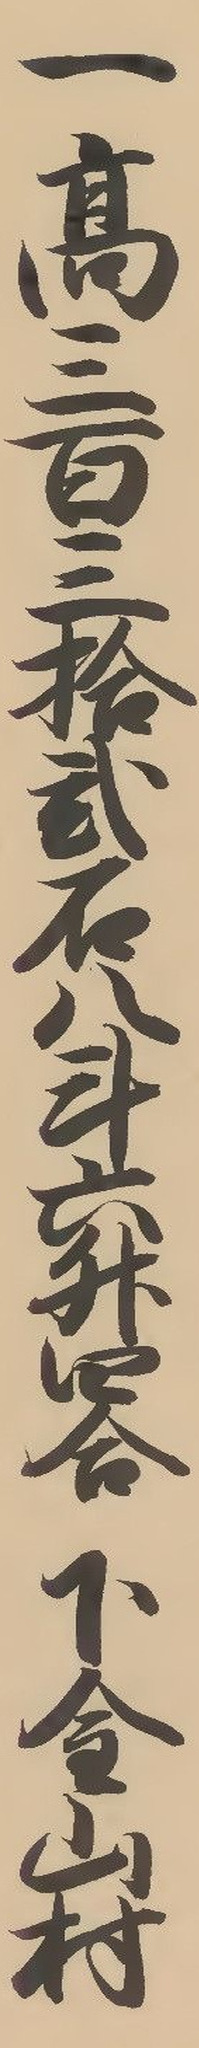一高三百三拾弐石八斗六升四合下金山村
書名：下総国郷帳
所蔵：国立公文書館 National Archives of Japan
